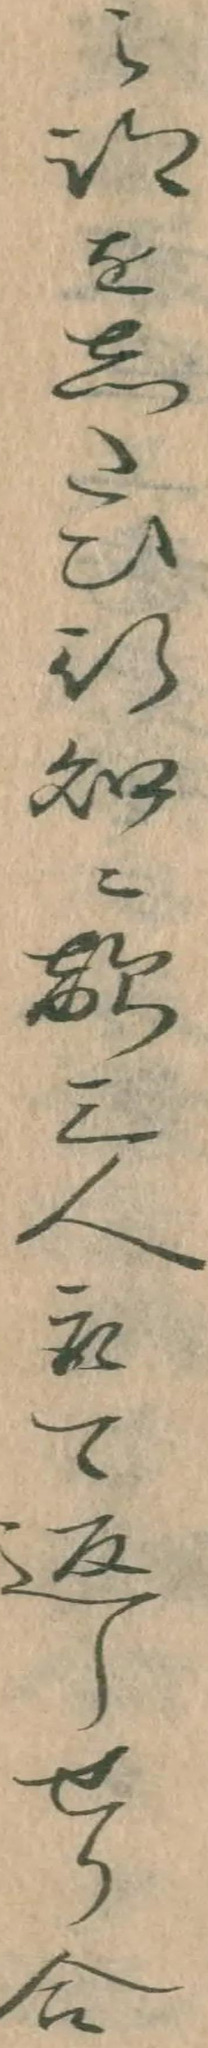之跡を志たひ行処に敵三人取て返しせり合
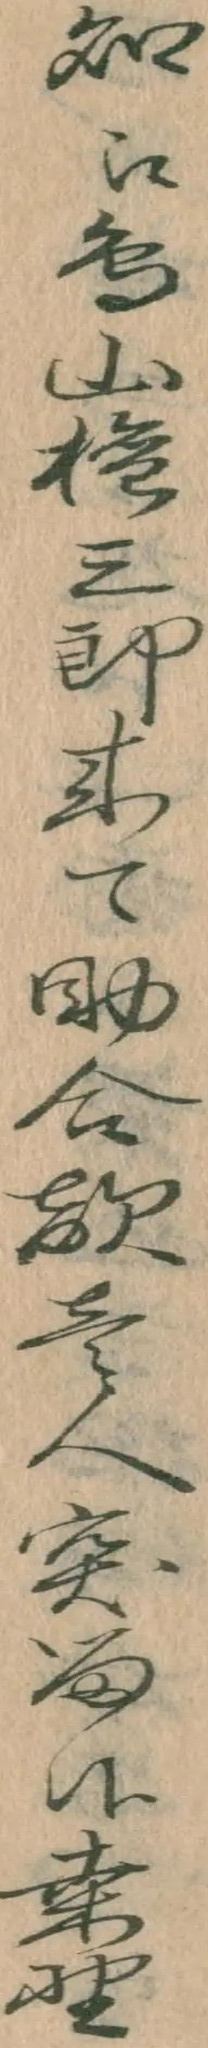処江鳥山権三郎来て助合敵壱人突留候桑野
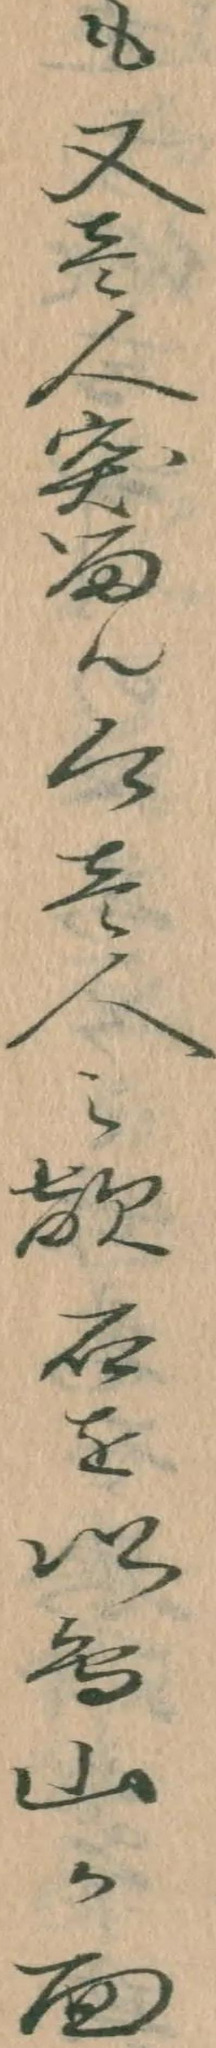も又壱人突留ん今壱人之敵石を以鳥山か面
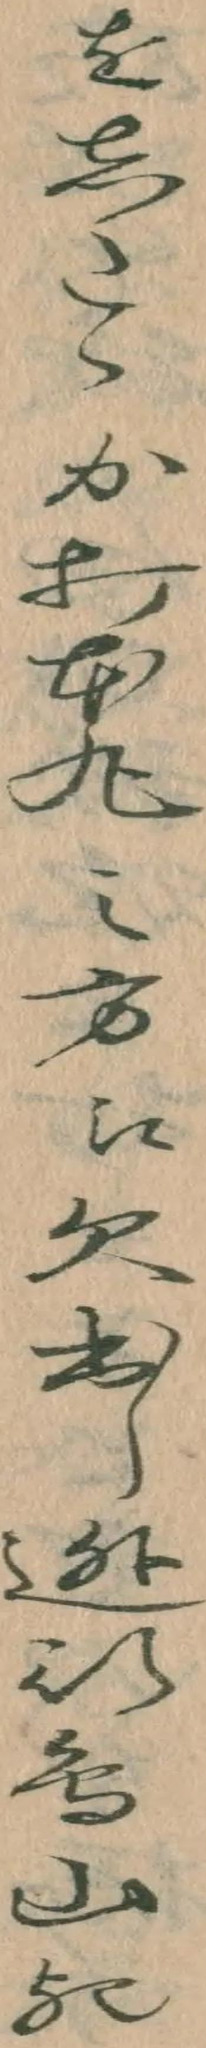を志たゝか打本丸之方江欠出し逃行鳥山歟
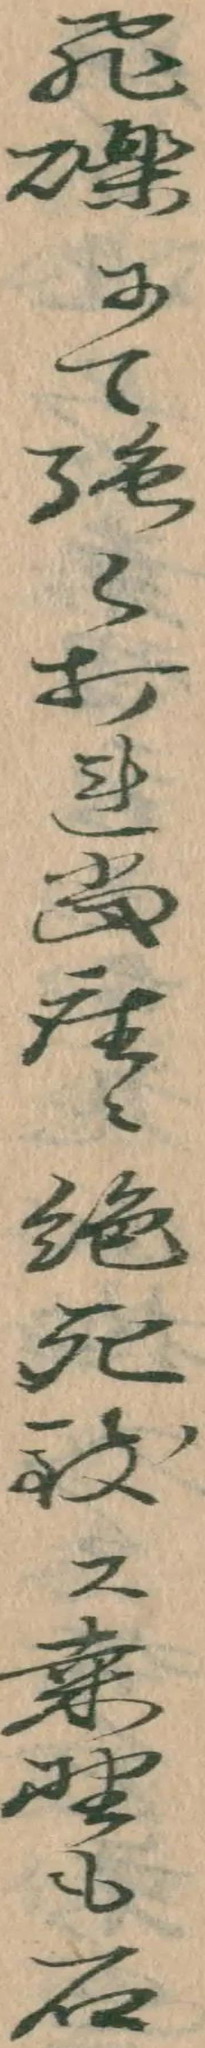飛礫尓て強く打連当座に絶死致す桑野も石
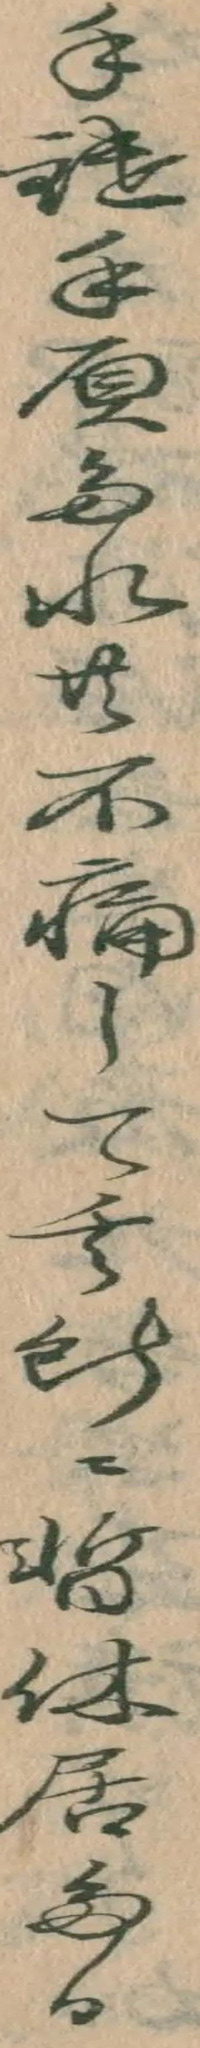手鑓手負多れ共不痛して其所に暫休居多る
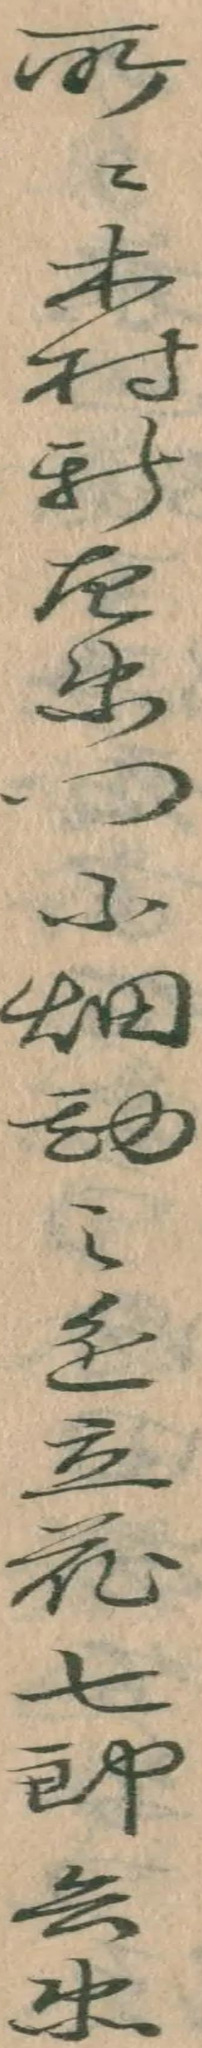所に木村新左衛門小畑勘之進立花七郎兵衛
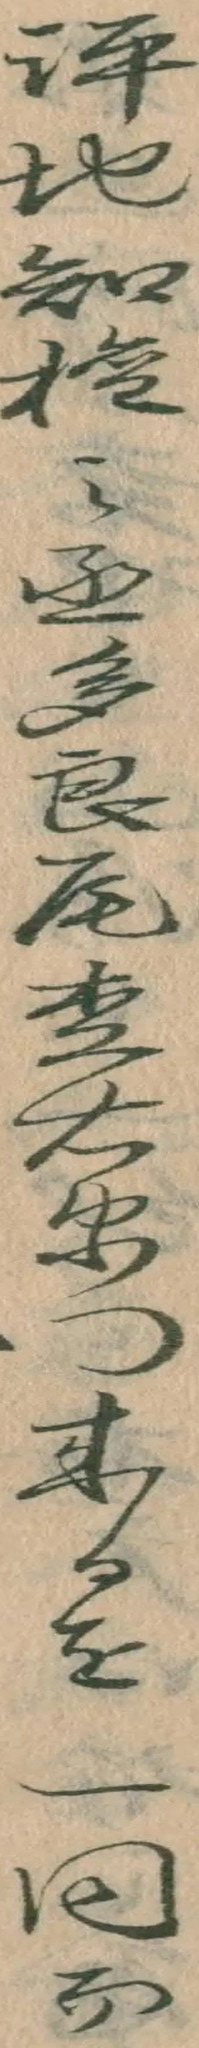評地知権之丞多良尾杢右衛門来るを一同而
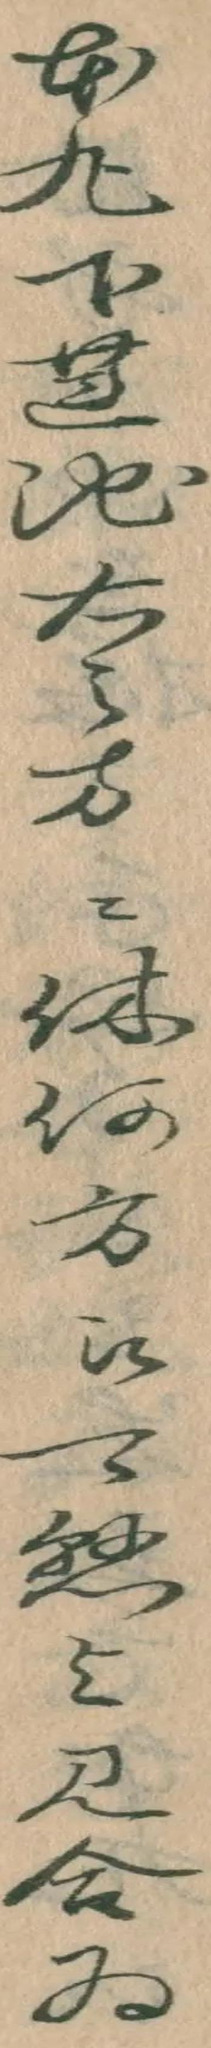本丸下蓮池右之方に休何方江可懸与見合ゐ
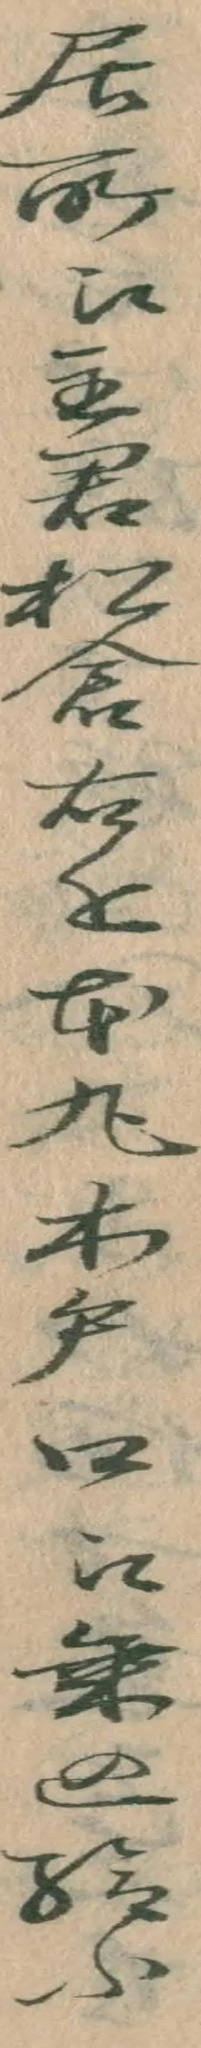居所江主君松倉右近本丸木戸口江乗込給ふ
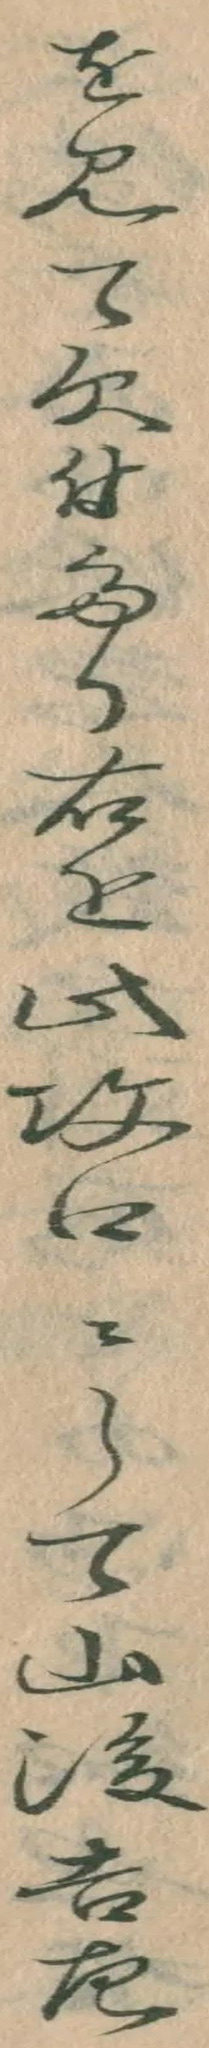を見て欠付多り右近此攻口にして山後吉左
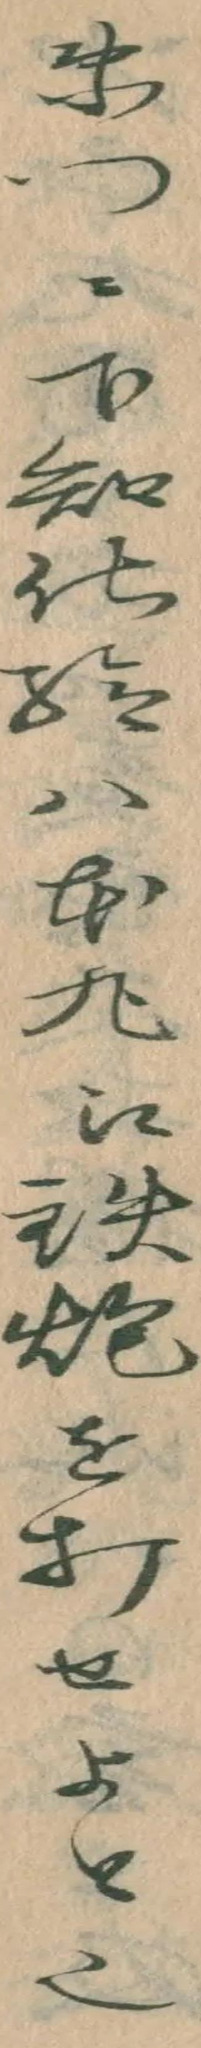衛門に下知仕給は本丸江鉄砲を打せよと也
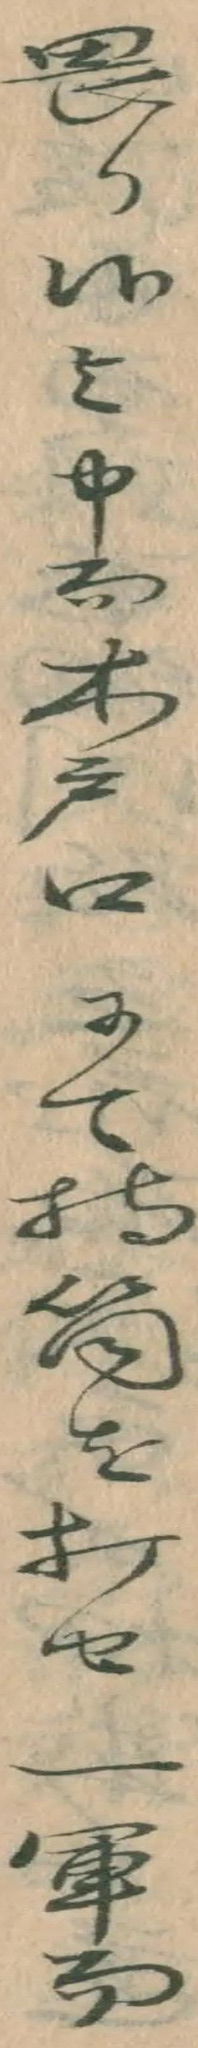畏り候与申而木戸口尓て持筒を打せ一軍而

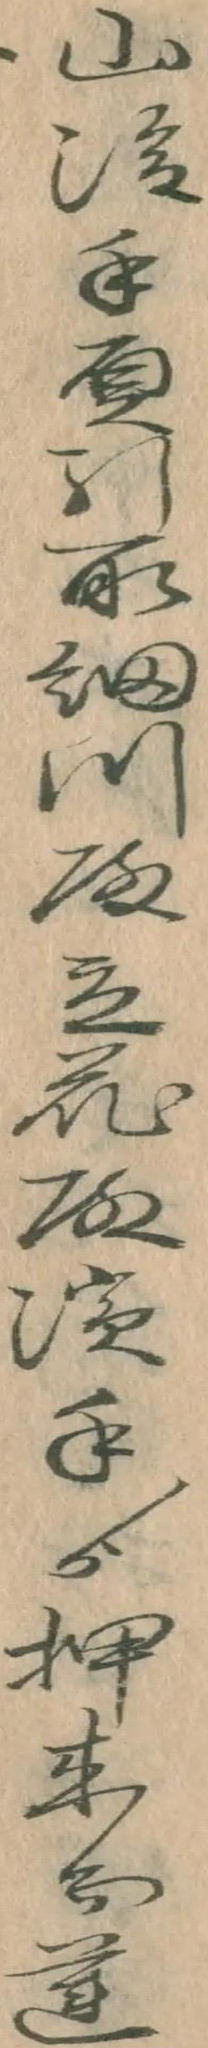山後手負引取細川殿立花殿浜手ゟ押来而蓮
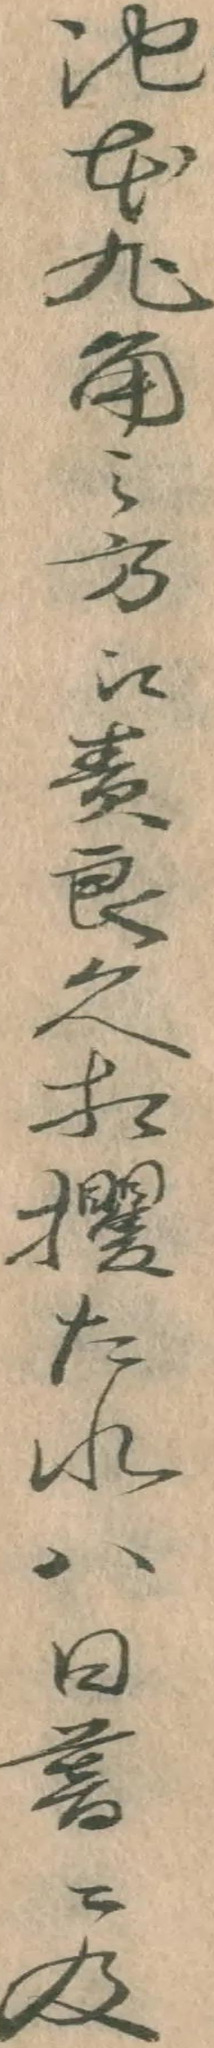池本丸角之方江責良久相攫たれは日暮に及
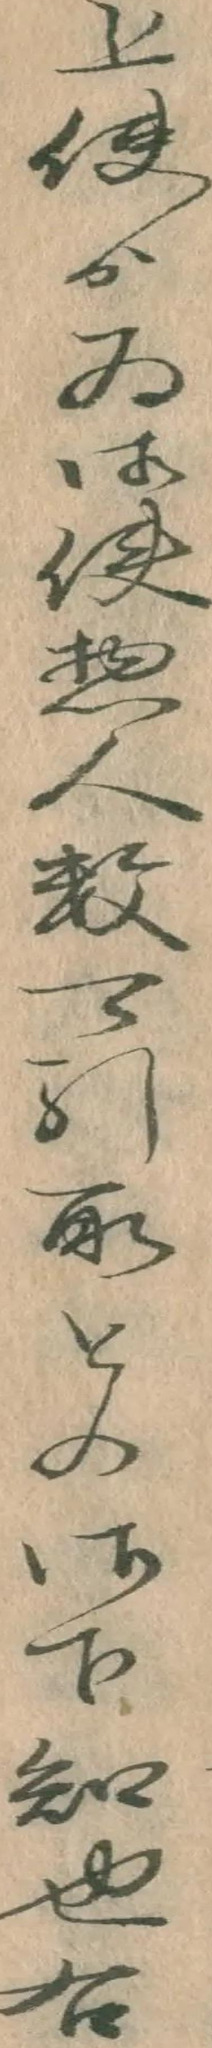上使ゟゐ御使惣人数可引取との御下知也右
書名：切支丹御退治記 49巻. [8]
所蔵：国立国会図書館 National Diet Library, JAPAN
